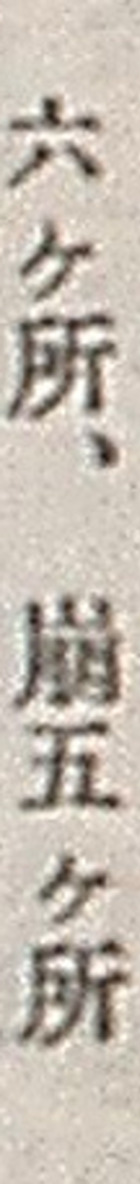六ヶ所、崩五ヶ所
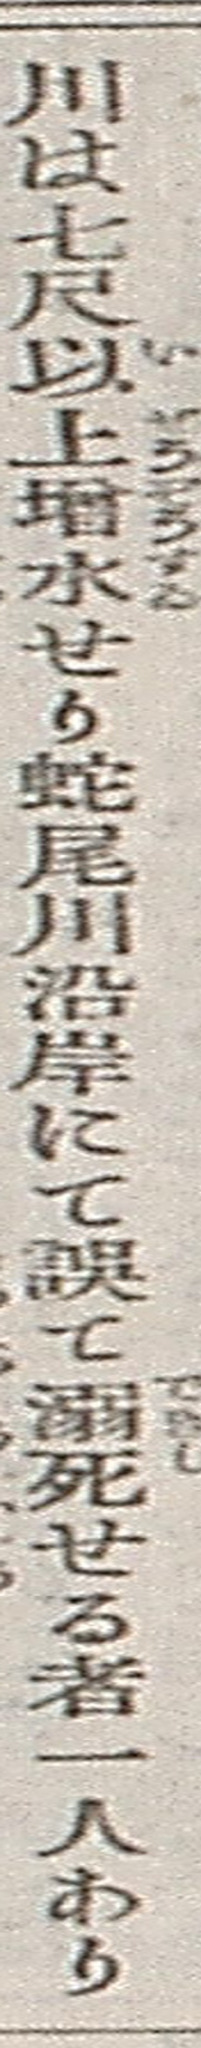川は七尺以上増水せり蛇尾川沿岸にて誤て溺死せる者一人あり
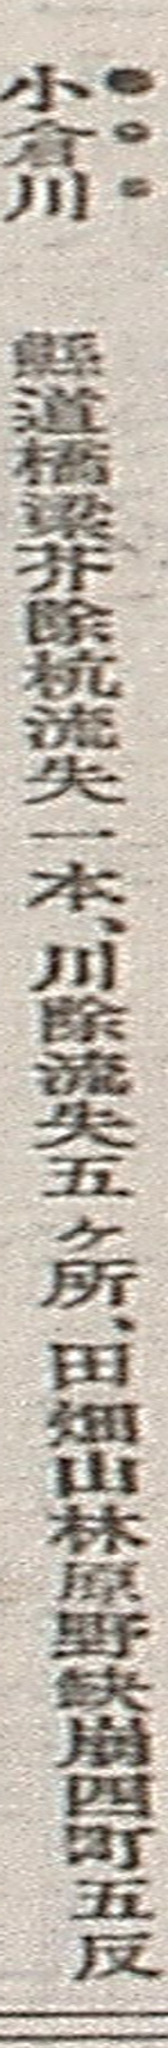小倉川県道橋梁芥除杭流失一本、川除流失五ヶ所田畑山林原野缺崩四町五反
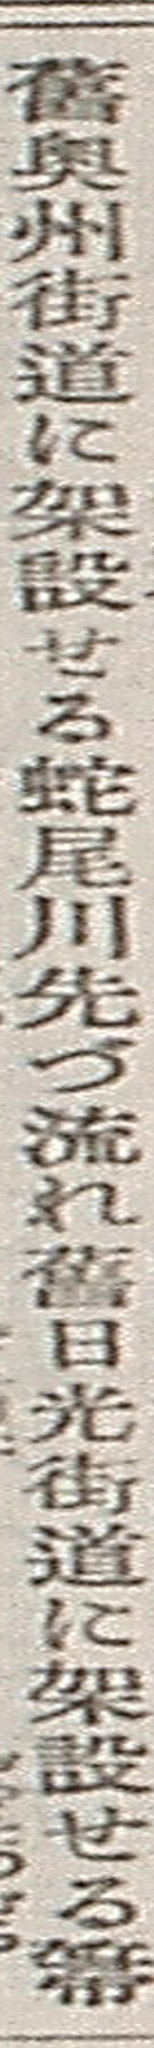旧奥州街道に架設せる蛇尾川先づ流れ旧日光街道に架設せる箒
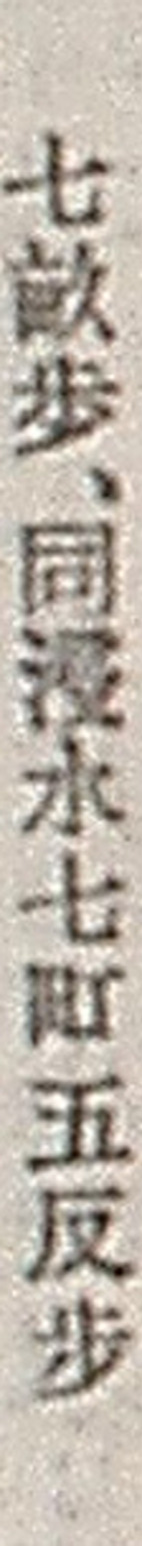七畝歩、同浸水七町五反歩
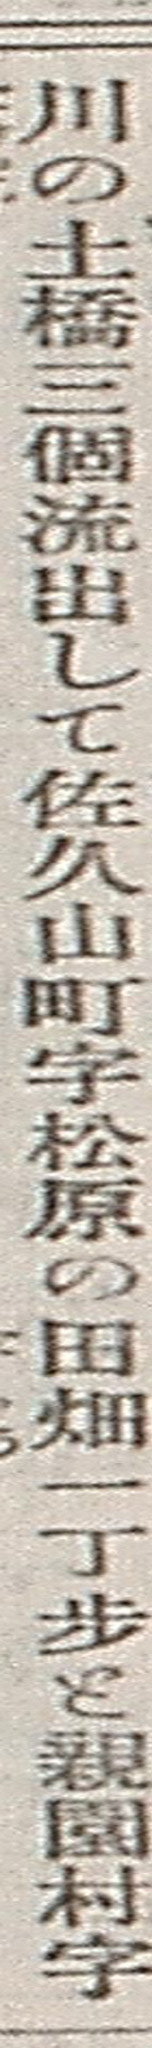川の土橋三個流失して佐久山町字松原の田畑一丁歩と親園村字
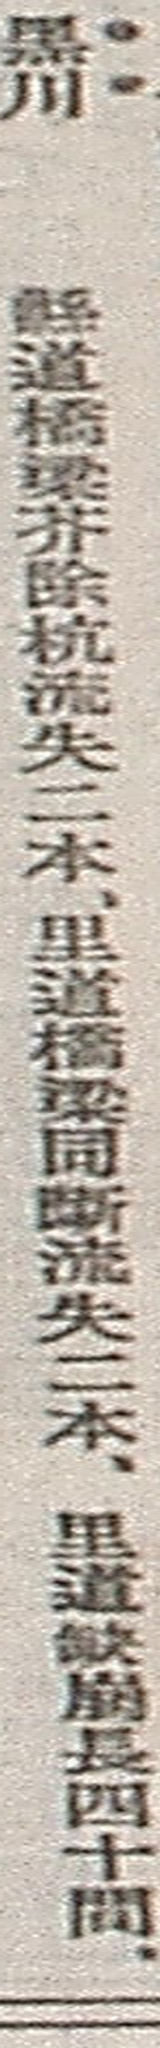黒川県道橋梁芥除杭流失二本、里道橋梁同断流失二本、里道缺崩長四十間、
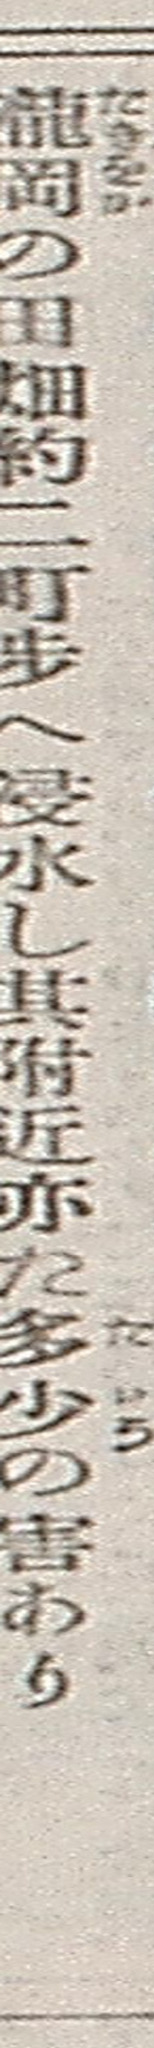瀧岡の田畑約二町歩へ浸水し其附近亦た多少の害あり
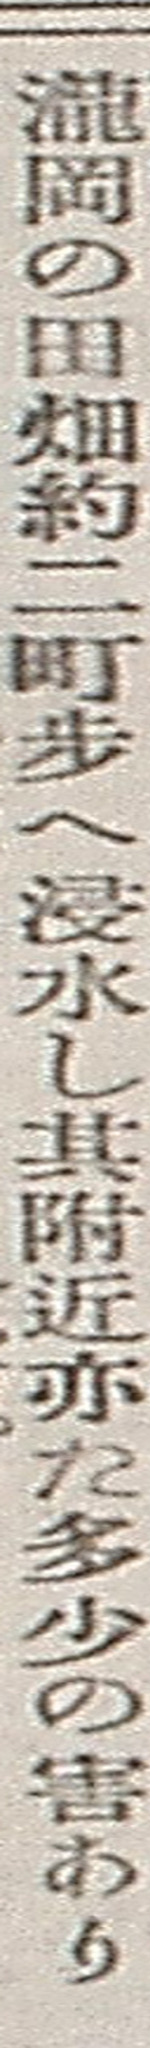瀧岡の田畑約二町歩へ浸水し其附近亦た多少の害あり
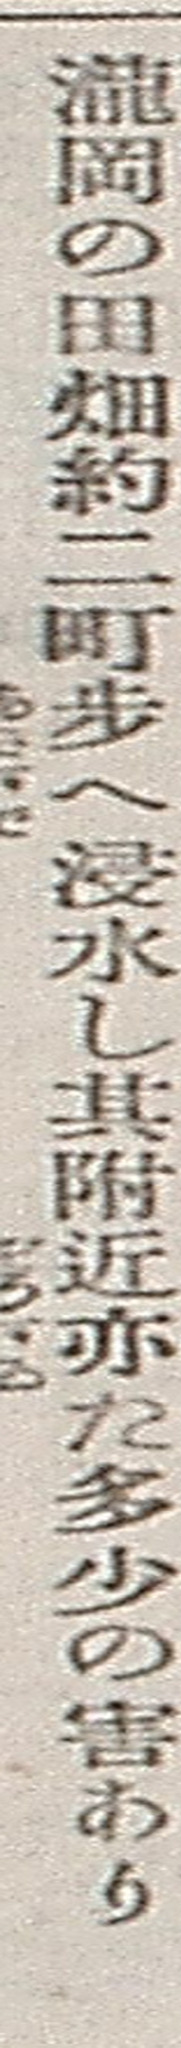瀧岡の田畑約二町歩へ浸水し其附近亦た多少の害あり
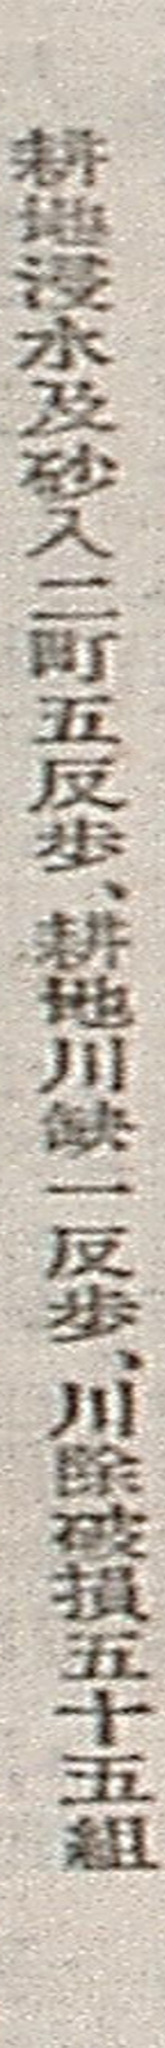耕地浸水及砂入二町五反歩、耕地川缺一反歩、川除破損五十五組
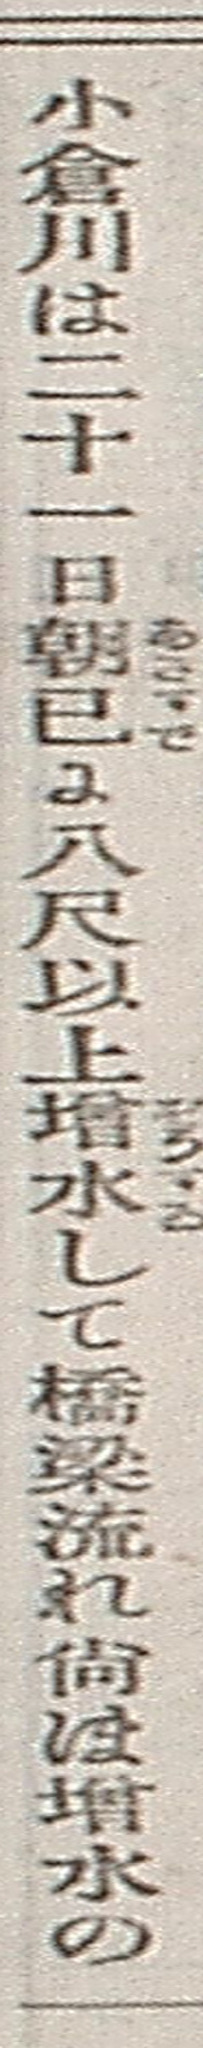小倉川は二十一日朝已に八尺以上増水して橋梁流れ尚ほ増水の
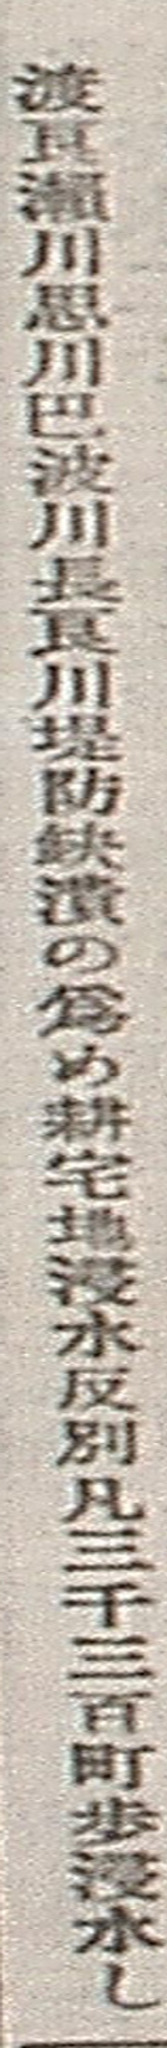渡良瀬川思川巴波川長良川堤防缺潰の為め耕宅地浸水反別凡三千三百町歩浸水し

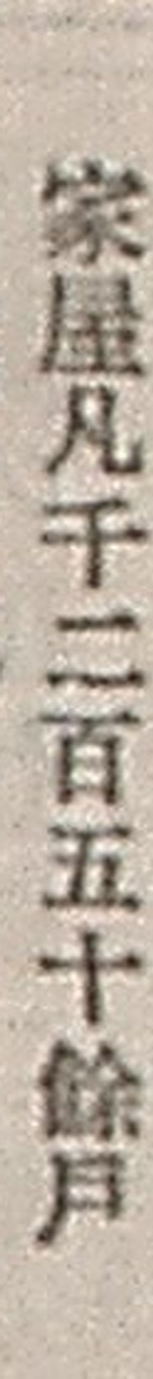家屋凡千二百五十餘戸
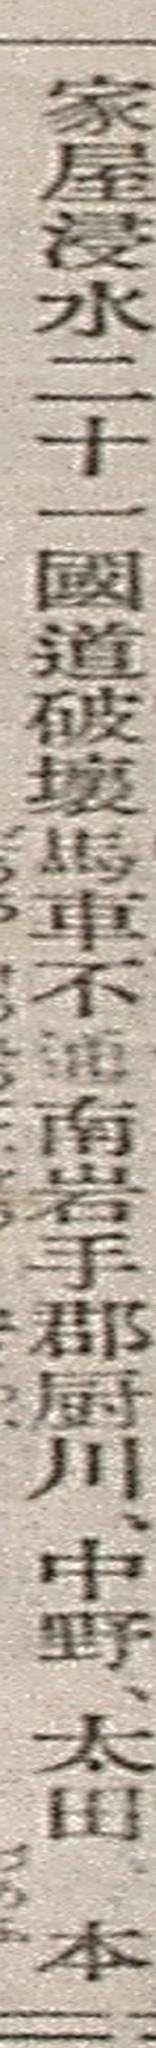家屋浸水二十一国道破壊馬車不通南岩手郡厨川、中野、太田、本
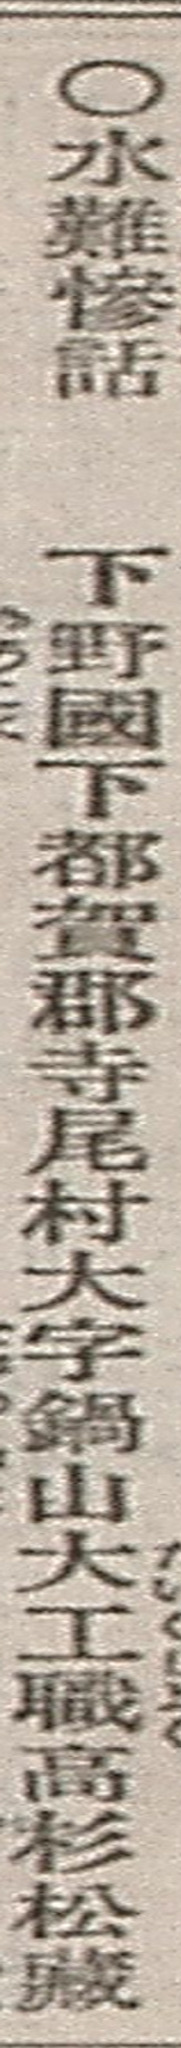○水難惨話下野国都下賀郡寺尾村大字鍋山大工職高杉松蔵
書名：風俗畫報臨時増刊第百二十八號　洪水被害録（下）
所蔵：東京大学地震研究所図書室 Earthquake Research Institute Library, The University of Tokyo, JAPAN
